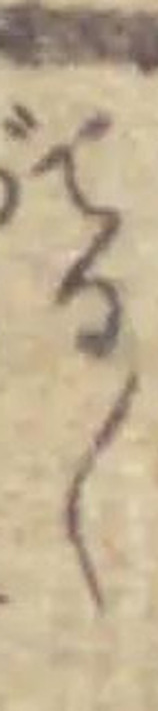てる〳〵
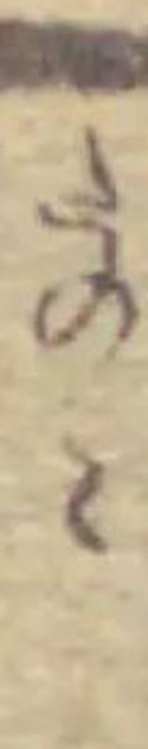たのみ
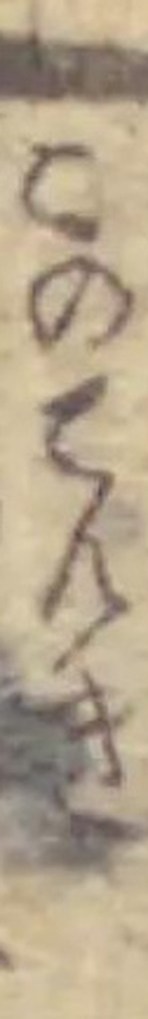このてんき
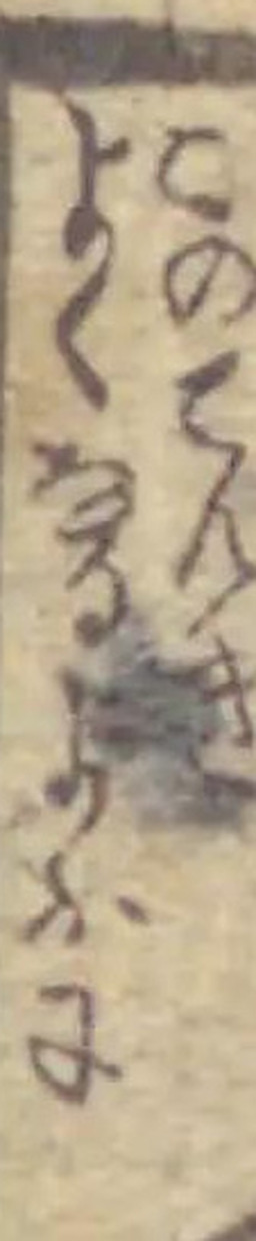よくなるよふに
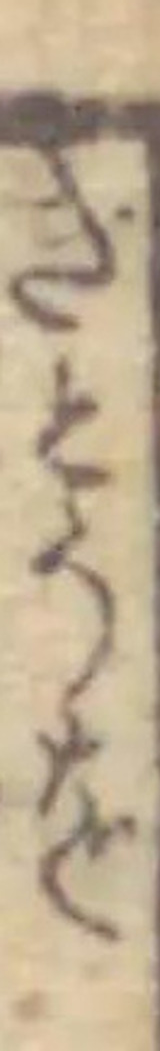きとうを
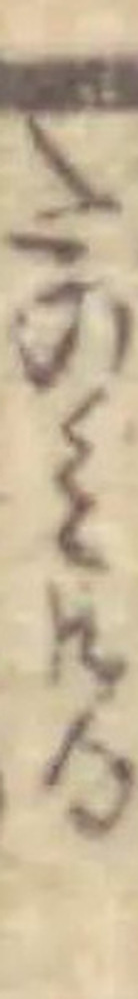たのみける
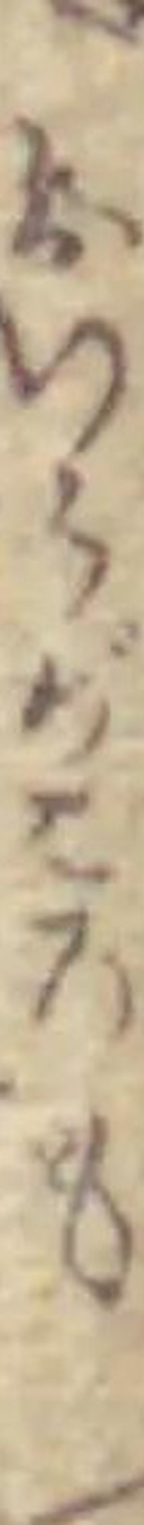おいらがころも
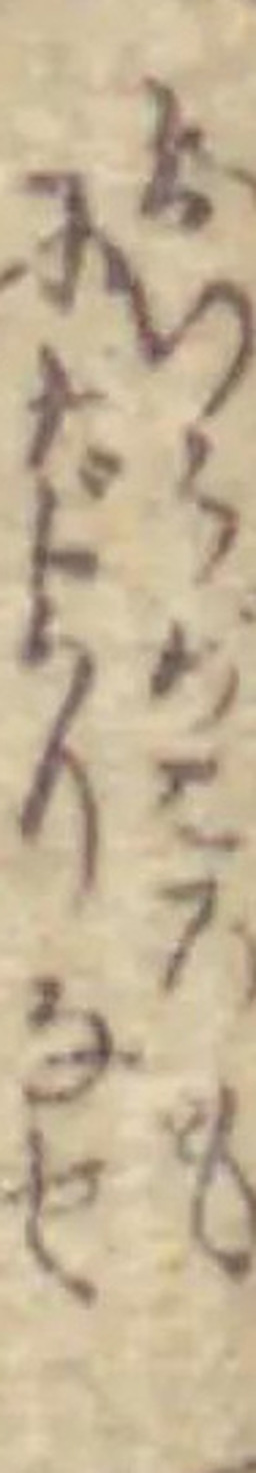に？ばかりなせ
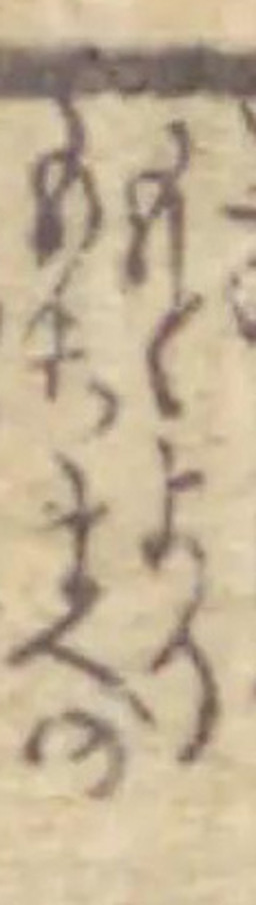もちまへの
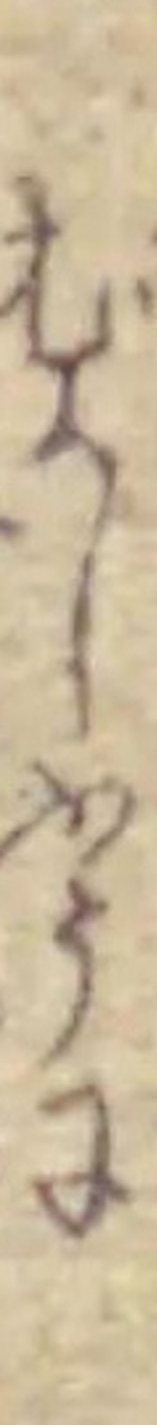むかしふうに
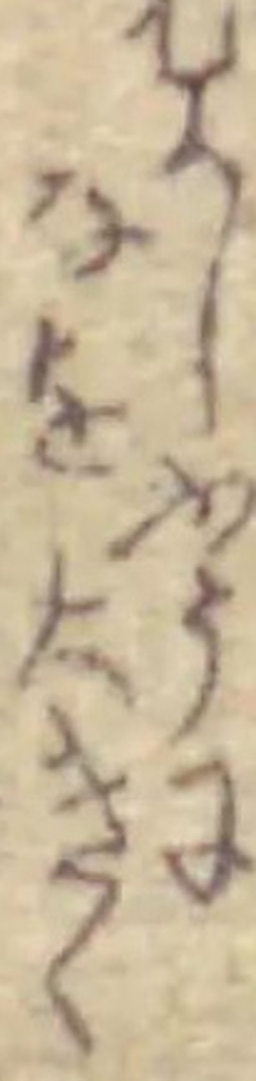なを大きく
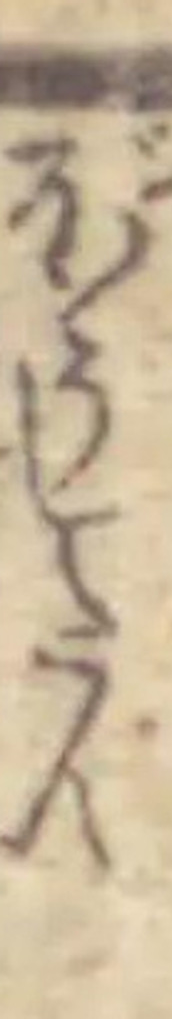ぼうしたん
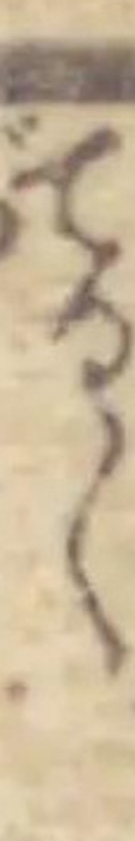てる〳〵
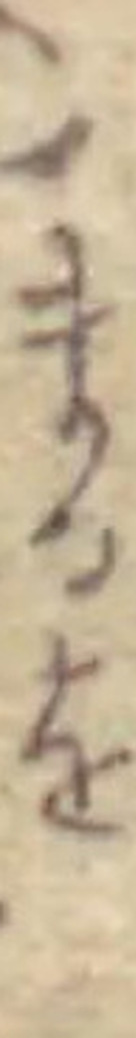まるを
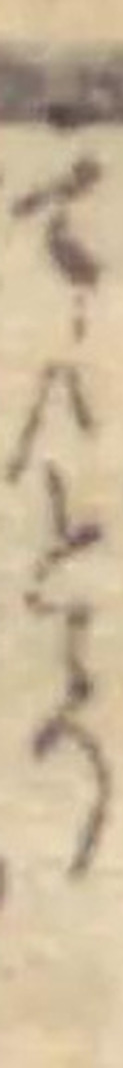てんとう
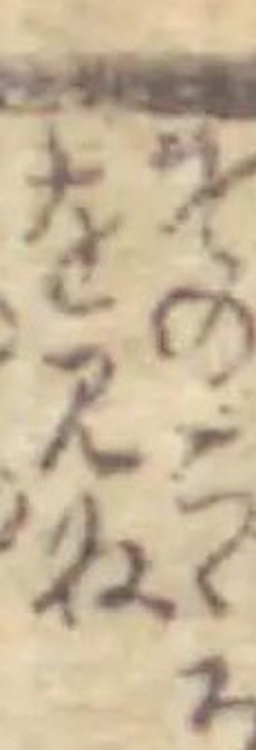を見ぬ
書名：雨宮風宮出儘略縁記 3巻
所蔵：国立国会図書館 National Diet Library, JAPAN
